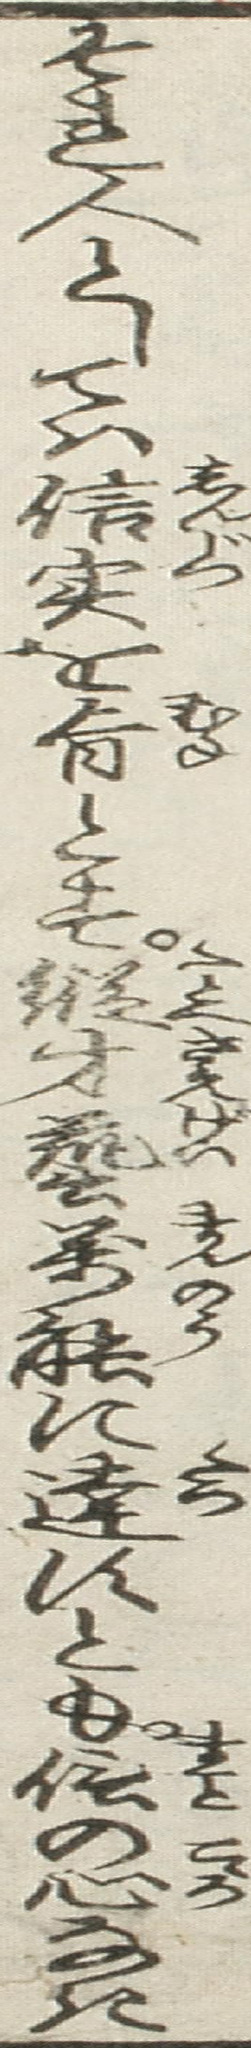それ人としては信実を旨とす。縦才芸万能に達すとも。信の心なき
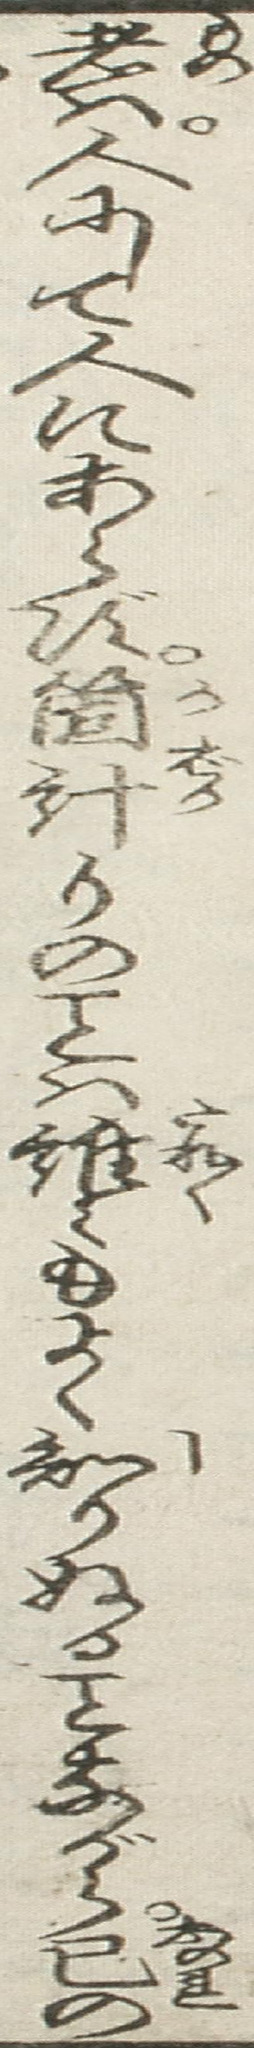者は。人にして人にあらず。箇計りのことは誰々もよく知りぬることながら。己の
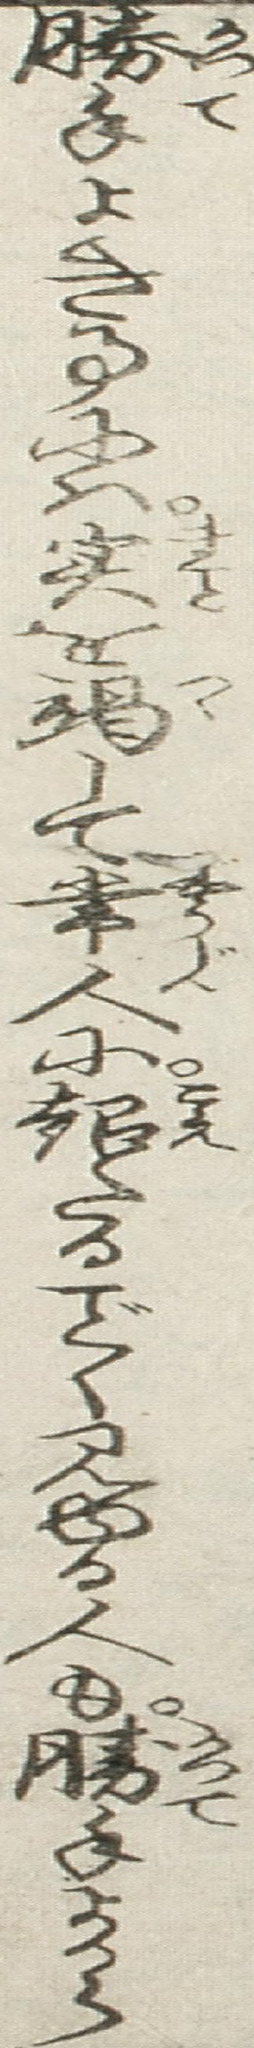勝手よき事には。実を竭して常人に。超たるごとく見ゆる人も。勝手よから
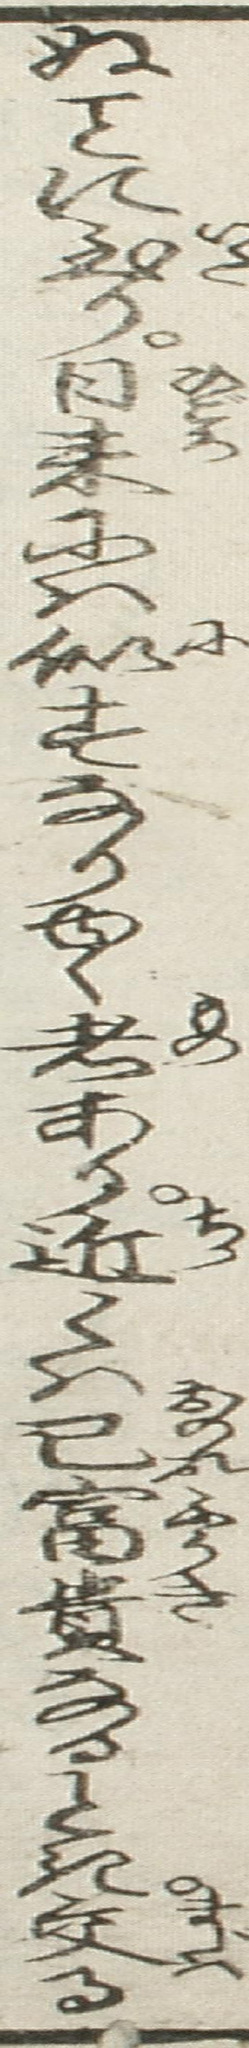ぬことに至り。日来には似すなりゆく者あり。近くは己富貴なるとき。交る
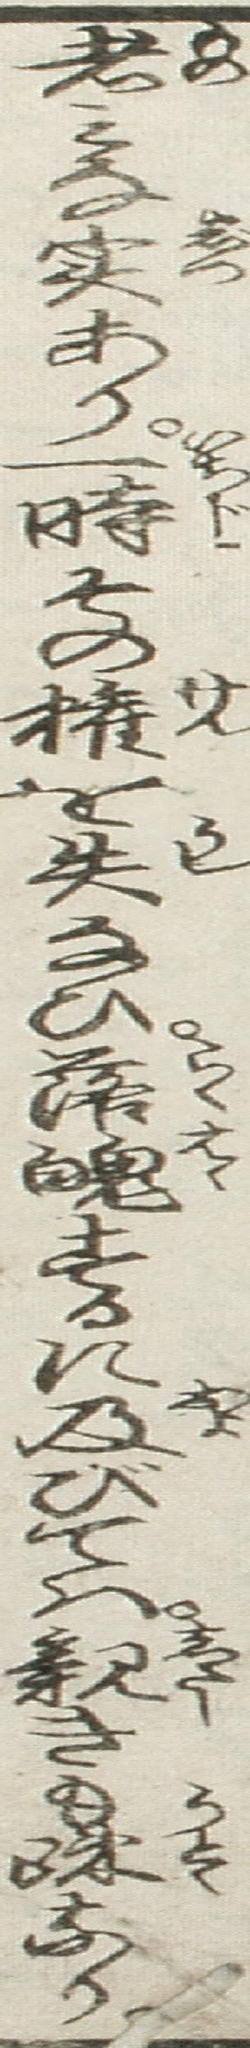者みな実あり。一時その権を失なひ。落魄するに及びては。親きも疎なり。
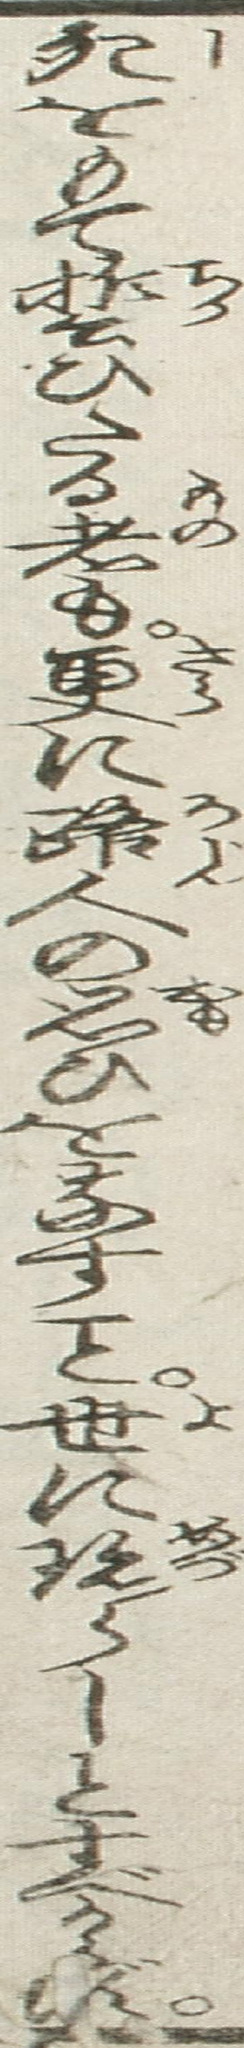死をもて誓ひたる者も。更に路人の思ひをなすこと。世に珍らしとすべからず。
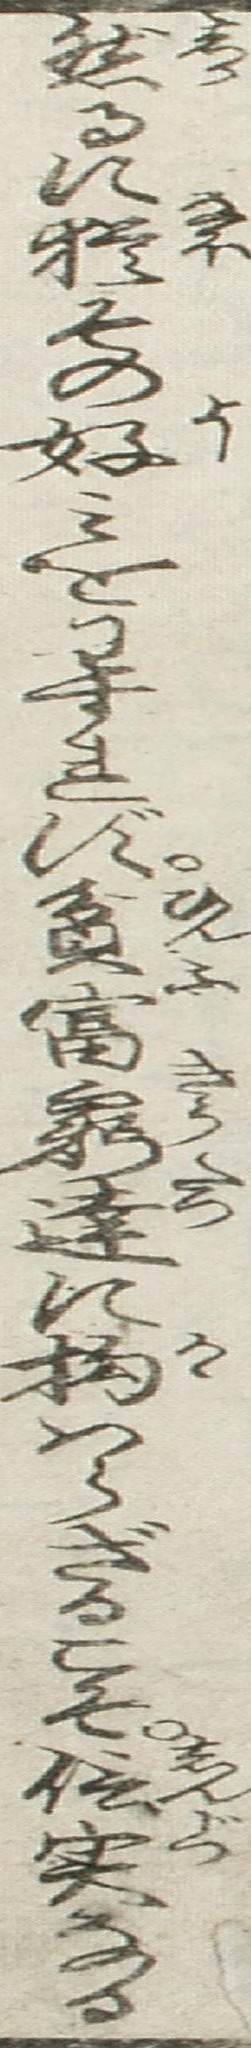然るに猶その好みをわすれず。貧富窮達に拘はらざるこそ。信実なる
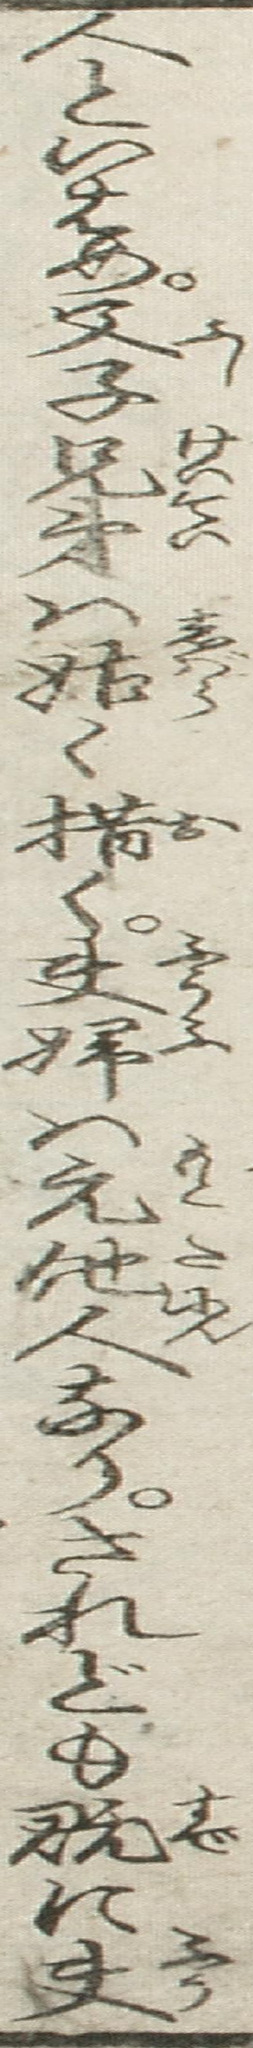人といはめ。父子兄弟は姑く措く。夫婦は元他人なり。されども既に夫
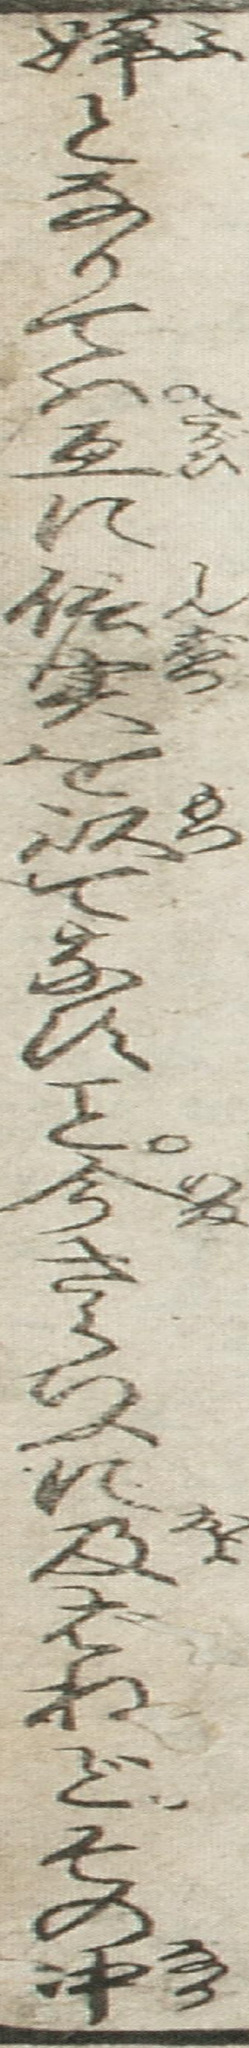婦となりては。互に信実を以てなすこと。今さらいふに及ばねど。その中

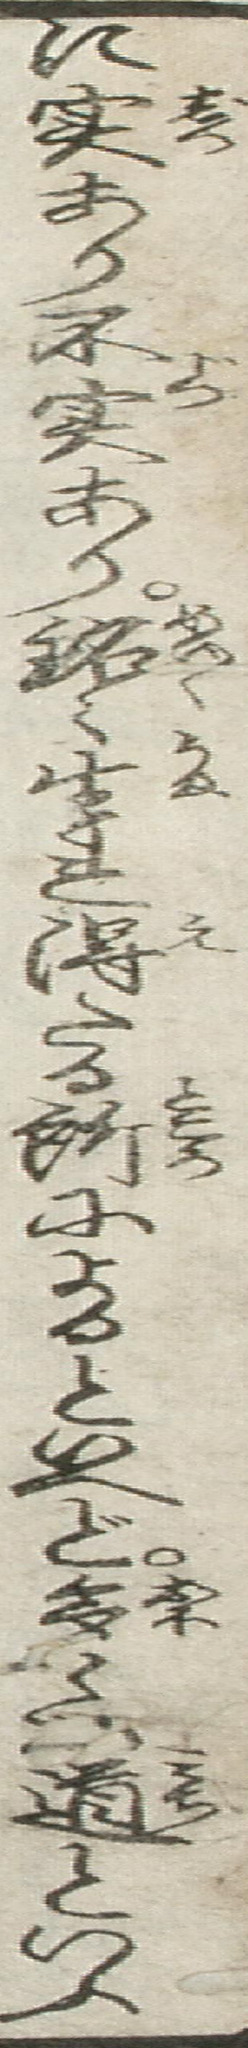に実あり不実あり。銘々生れ得たる所によるといへど。多くは道といふ
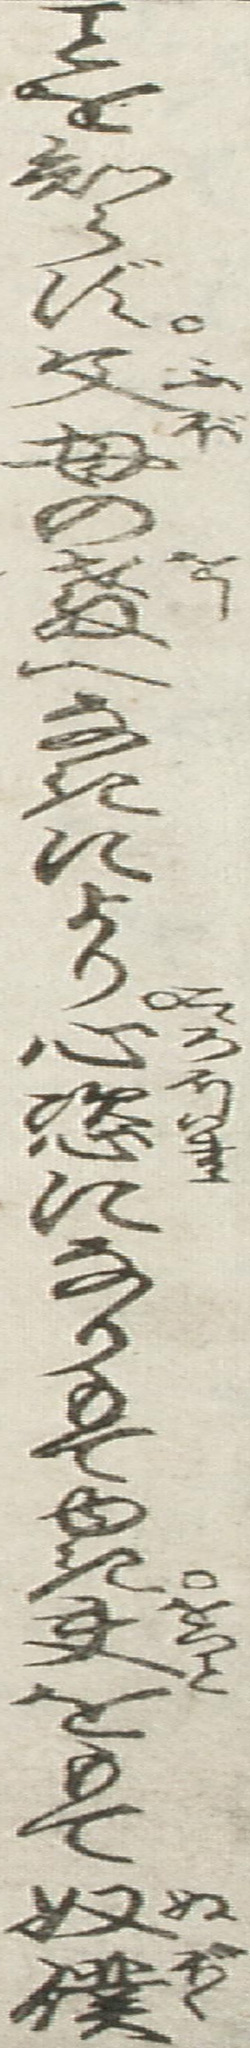ことを知らず。父母の教へなきにより。心恣になりもてゆき。夫をもて奴僕
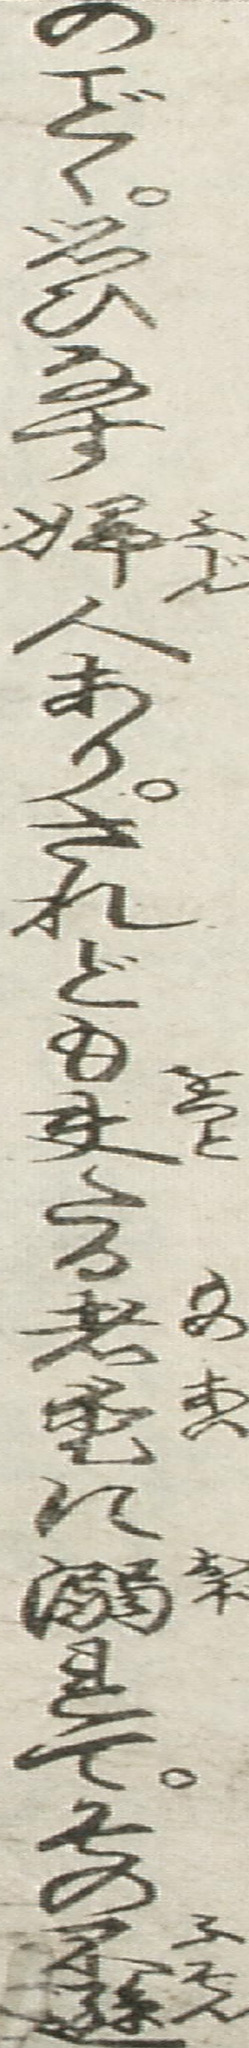のごとく。思ひなす婦人あり。されども夫たる者愛に溺れて。その不遜
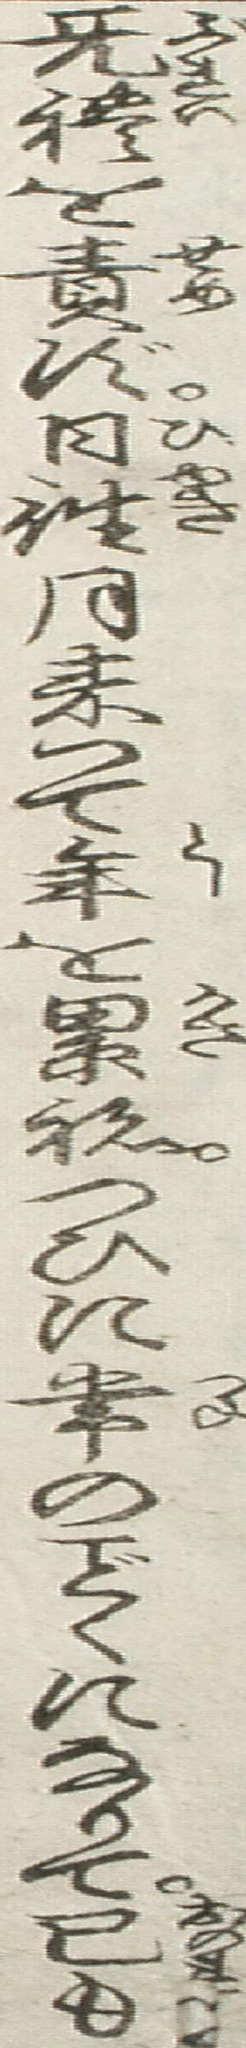無礼を責ず。日往月来つて年を累ね。つひに常のごとくになりて。己も
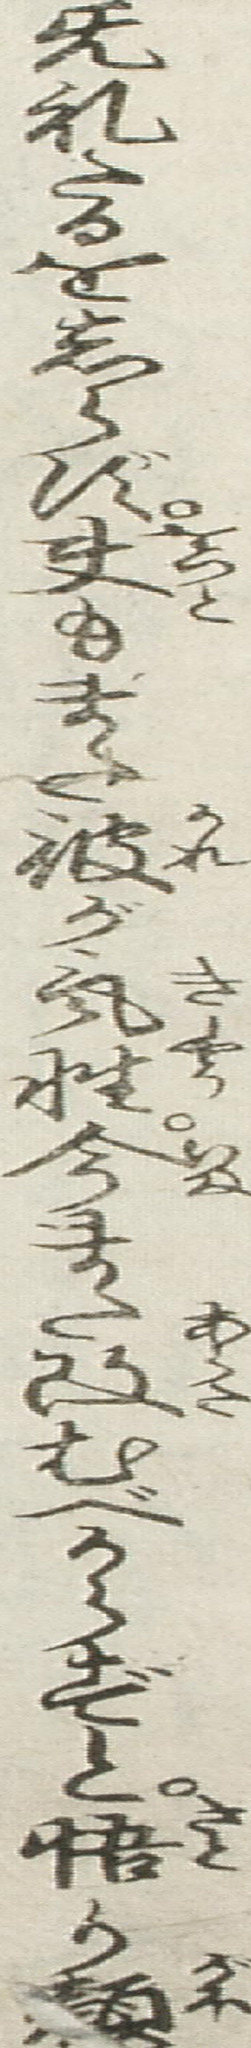無礼たるをしらず。夫もまた彼が気性。今また改むべからずと。悟り顔
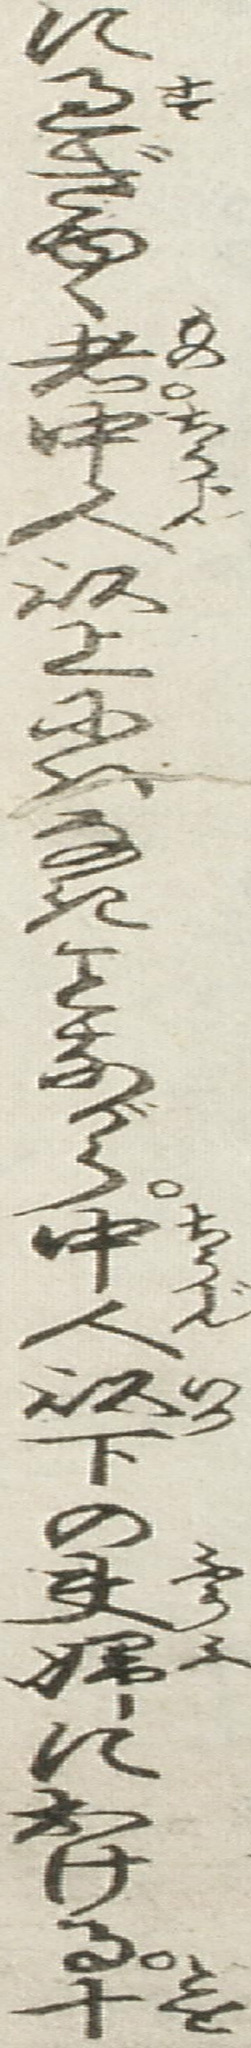に過ぎゆく者。中人以上にはなきことながら。中人以下の夫婦における。十
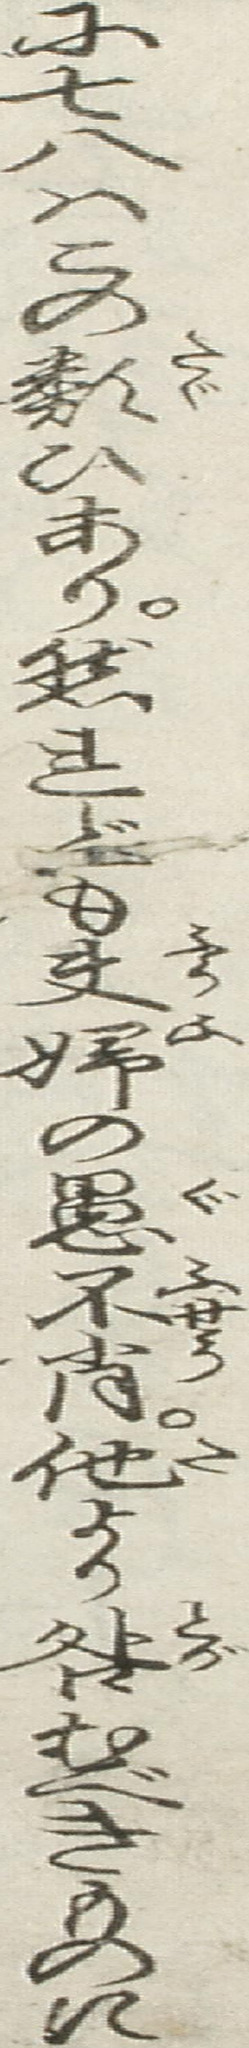に七八はこの類ひあり。然れども夫婦の愚不肖。他より咎むべきものに
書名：安政見聞録　下
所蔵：東京大学地震研究所図書室 Earthquake Research Institute Library, The University of Tokyo, JAPAN
